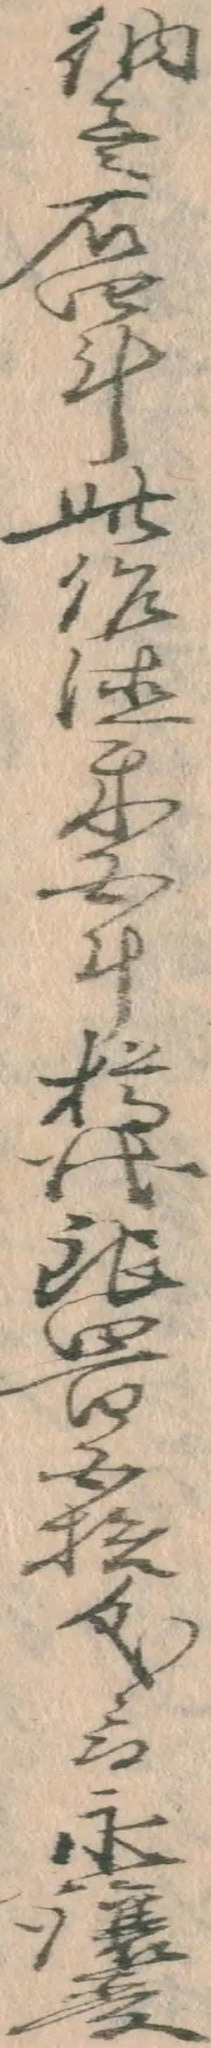納壱石四斗此作徳米五斗樽代銀四百五拾匁ニ而永譲受
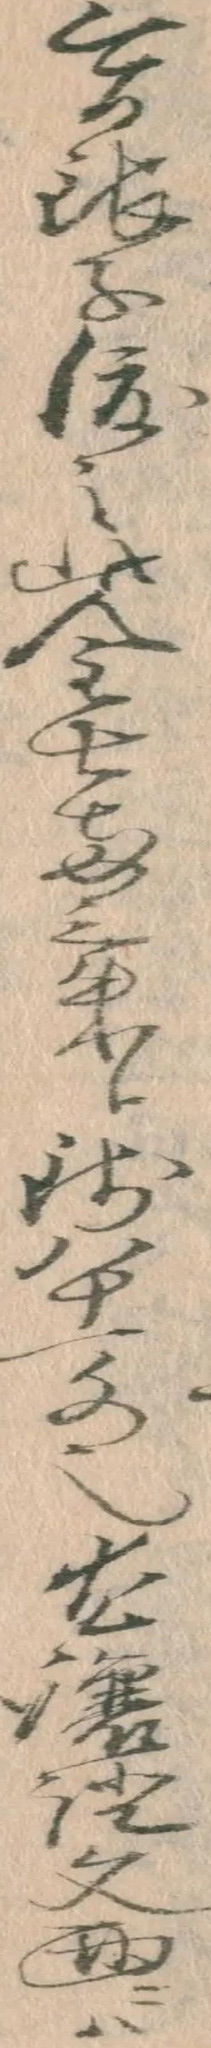今日銀子渡之此金七両三朱候銭八十一文也尤譲證文面ニハ
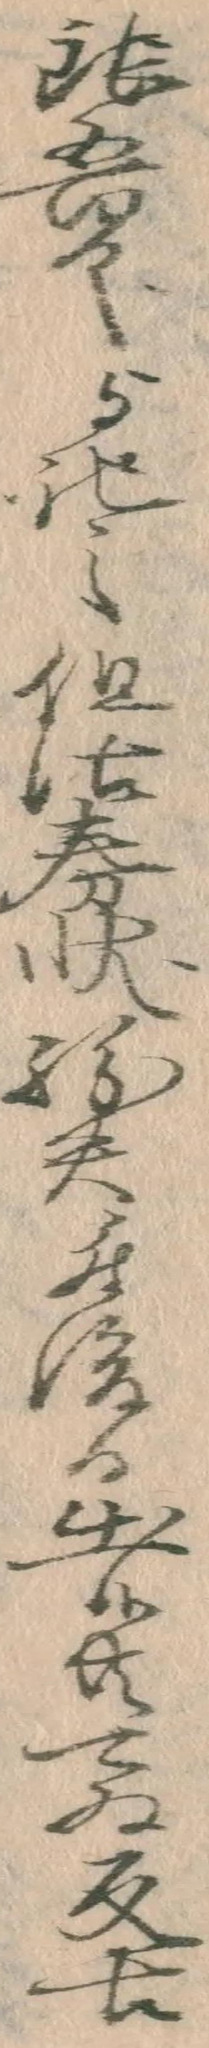銀五百匁と記之但沽券状紛失ニ付後日出候共可為反古
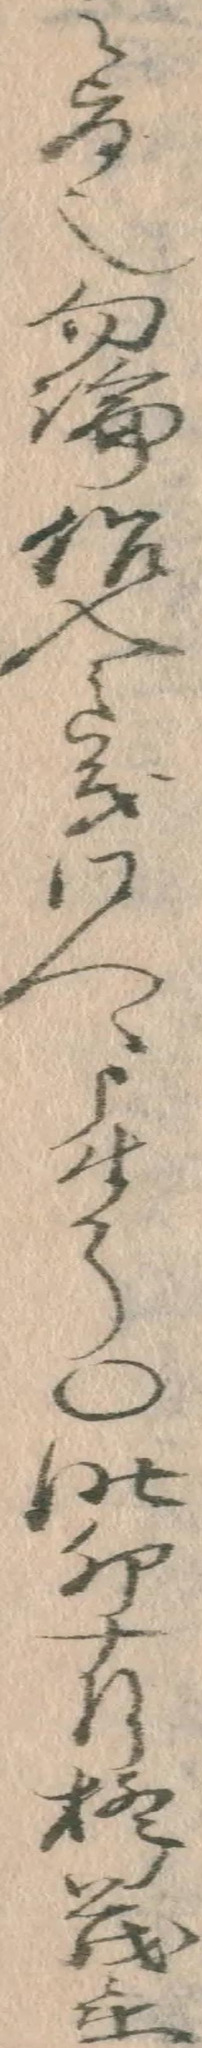之旨也勿論作入之義同人へ申付了○昨卯十月柊ノ茂兵衛
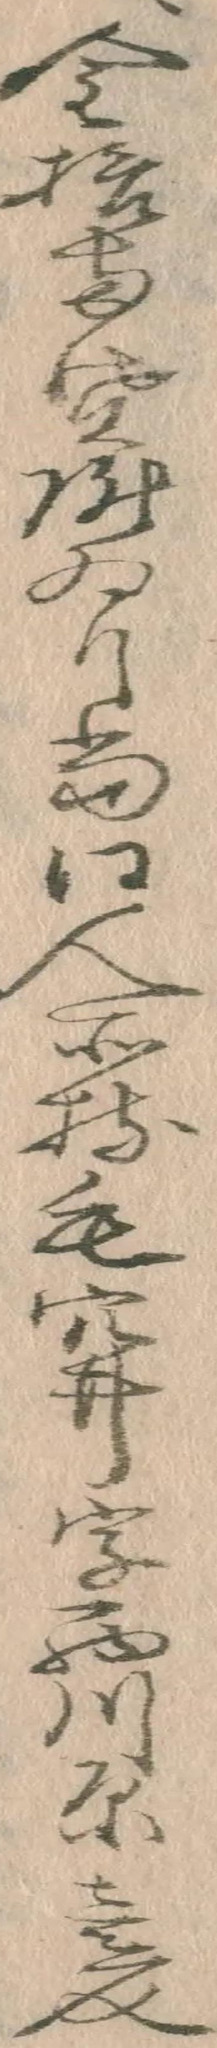ヘ金拾両貸附為引當同人所持毛穴井字西川原壱反
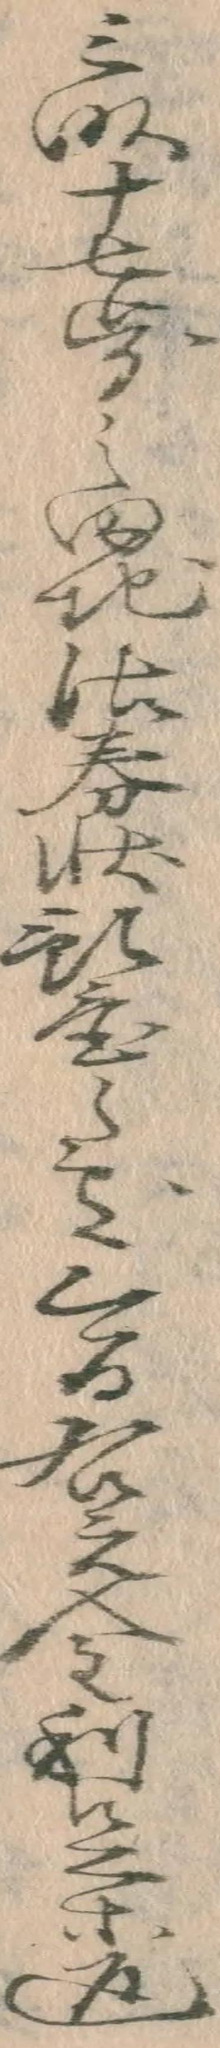三畝十七歩之田地沽券状預置候處今日右元金利足等返
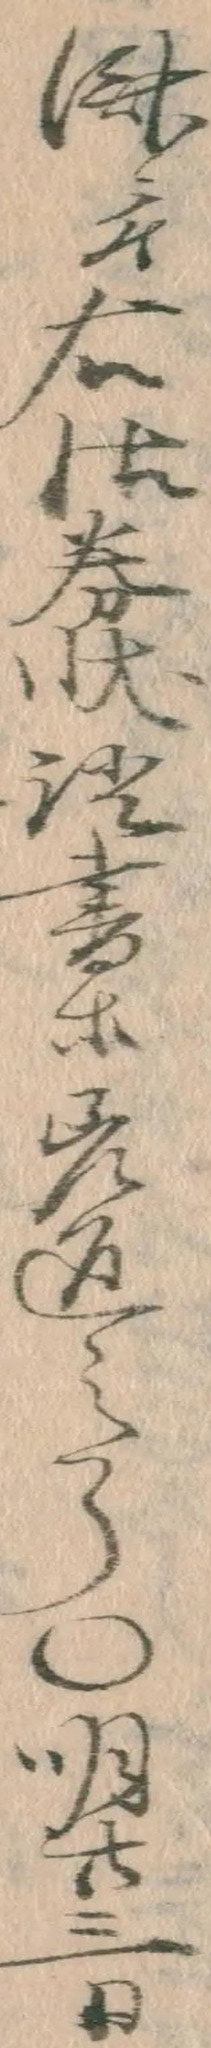済ニ付右沽券状證書等差返之了○明廿三日
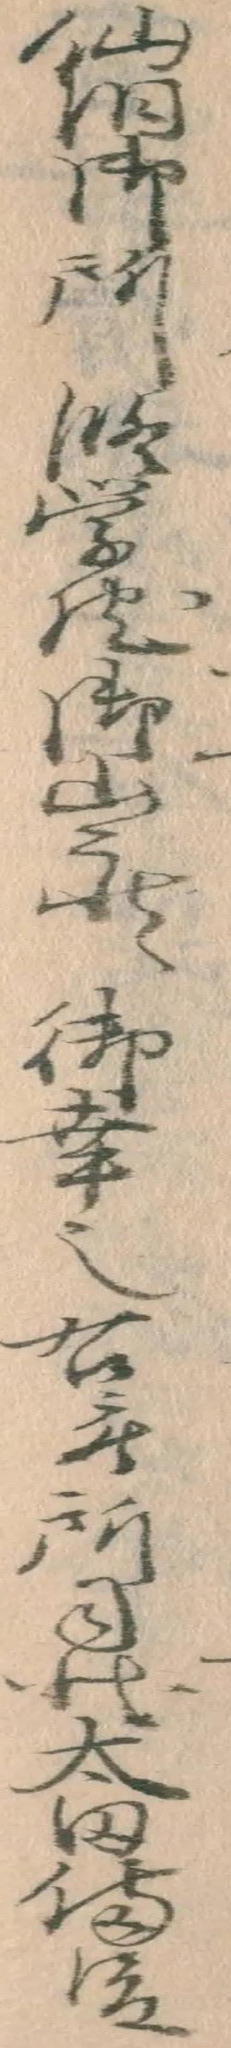仙洞御所修学院御山荘へ御幸也右ニ付所司代太田備後
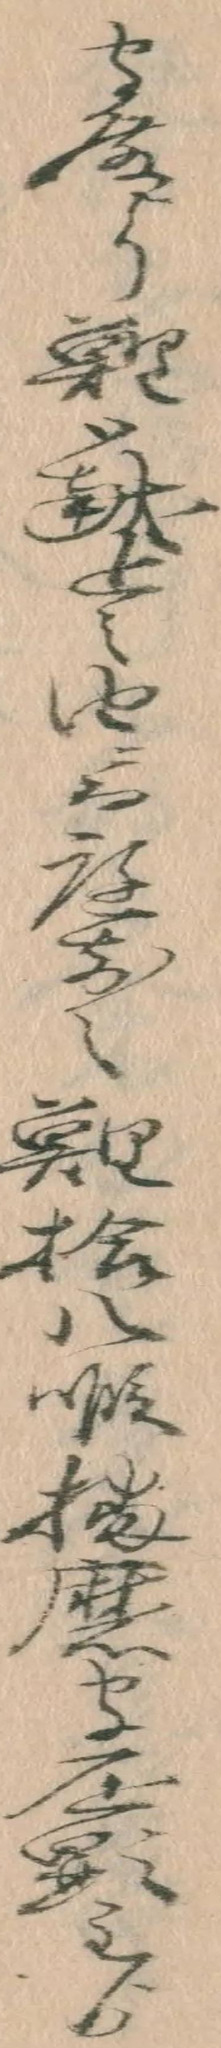守殿より鯉御献上之由ニ而庭前之鯉拾八喉播磨守丕顕主ゟ
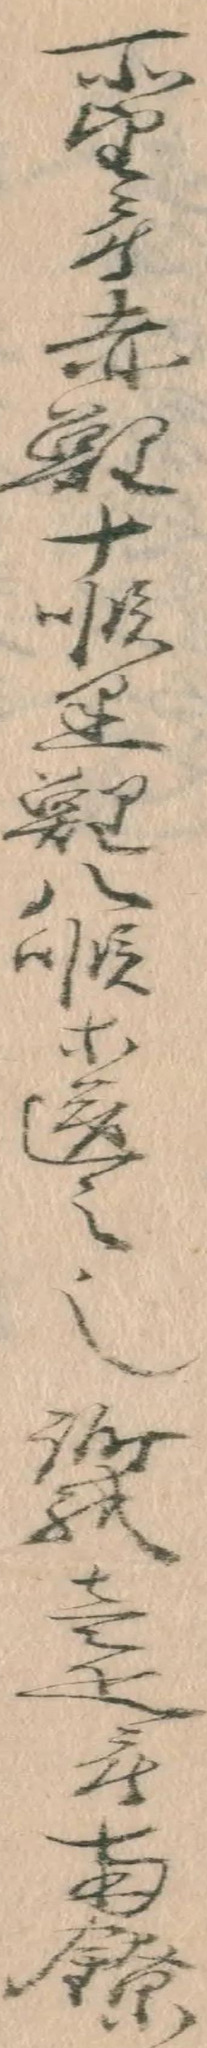所望ニ付赤鯉十喉黒鯉八喉等送之也附紙壱疋ニ付両鐐
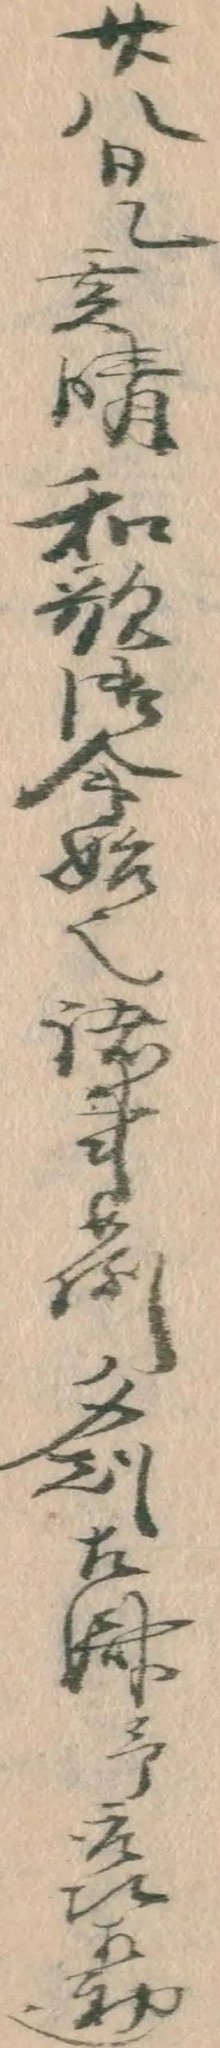廿八日乙亥晴和歌御會始之諸事如例夕刻相済予取次相勤也
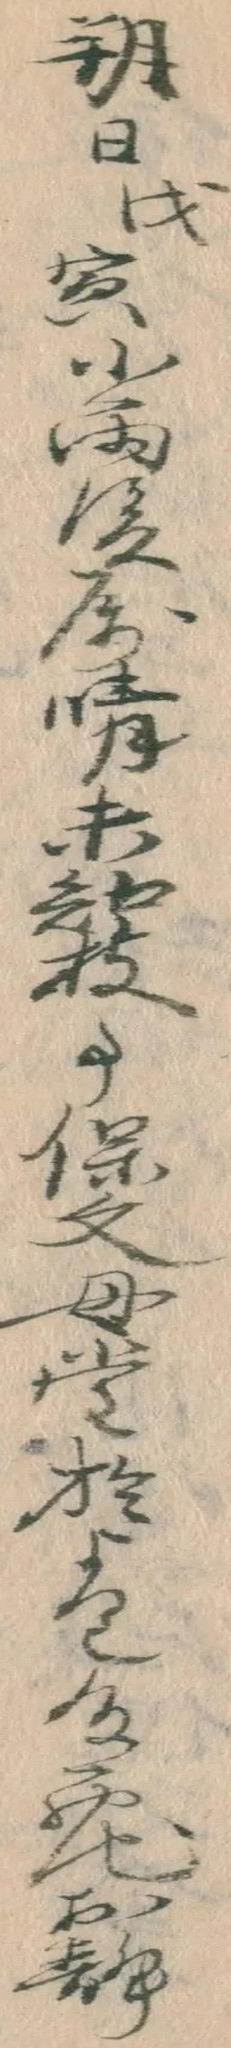朔日戊寅小雨後属晴未知枝事保文母堂於より故西地於静
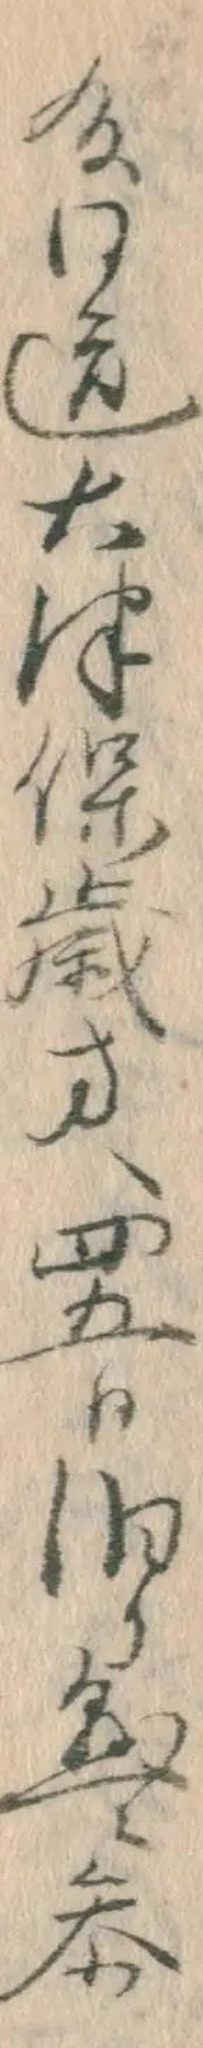殿同道大津保歳方へ四五日泊り懸ニ参
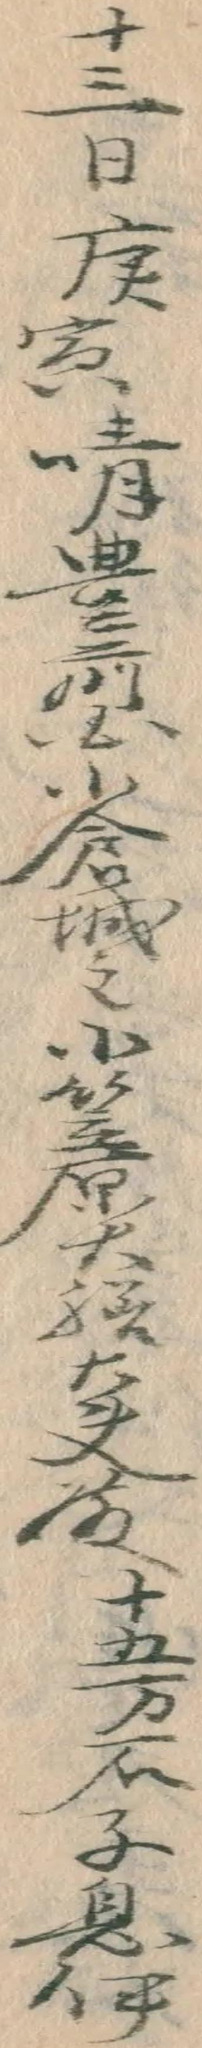十三日庚寅晴豊前国小倉城は小笠原大膳大夫殿へ十五万石子息伊
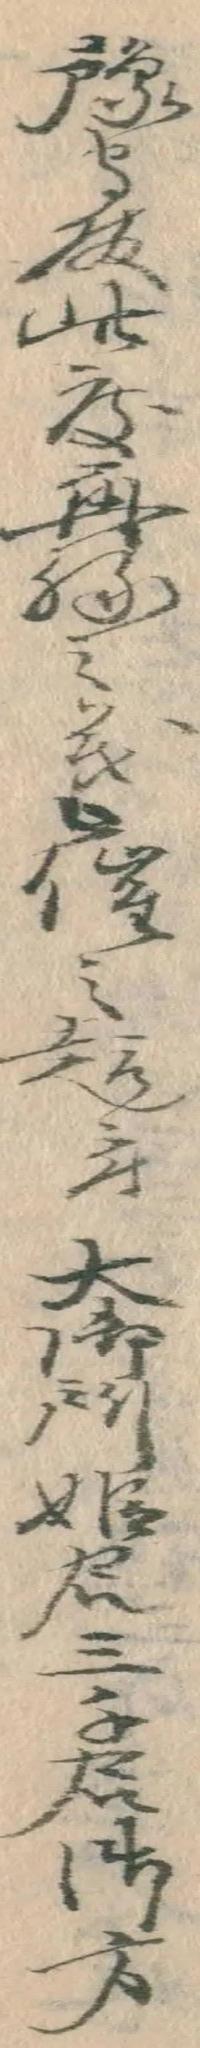豫守殿此度再縁之義御催之趣ニ付大御所姫君三千居御方
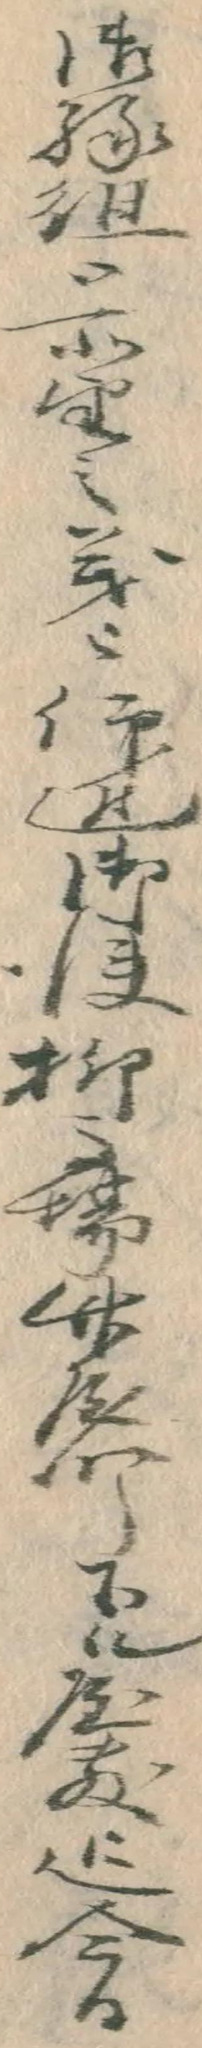御縁組御所望之義被仰近御使柳馬場竹屋町下ル屋敷迄今日
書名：賀茂社記録. 第66冊
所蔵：国立国会図書館 National Diet Library, JAPAN
